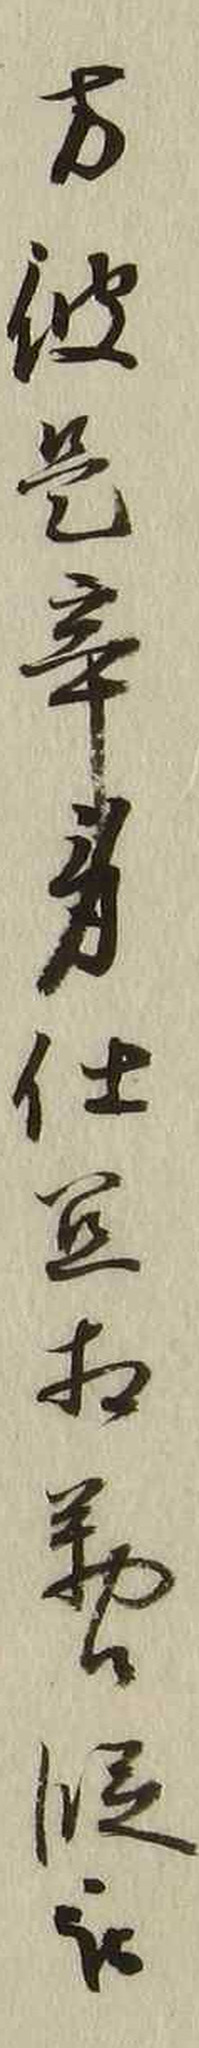方彼是辛労仕宜相勤候段被
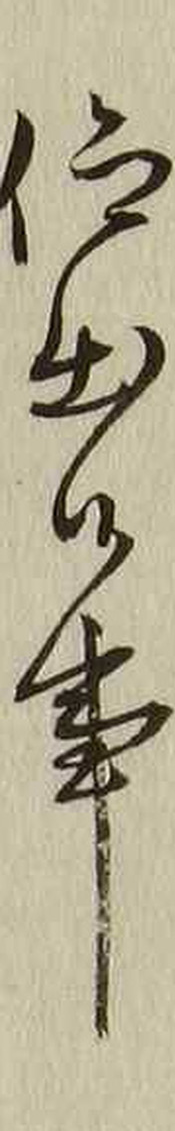仰出候事
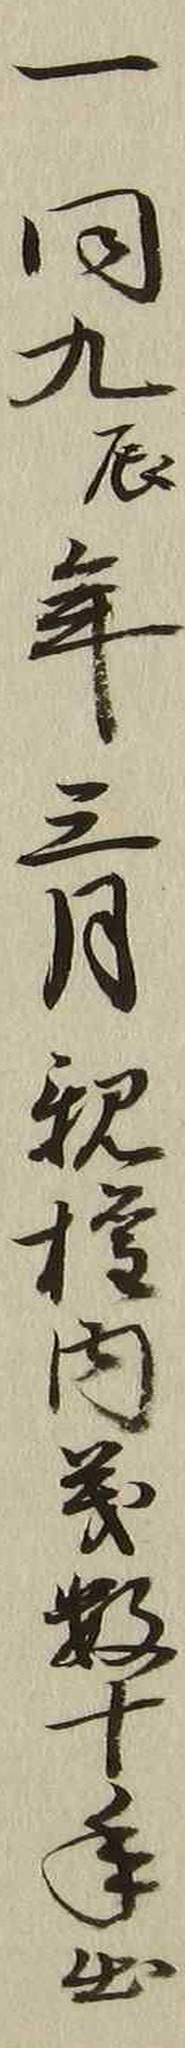一同九辰年三月親権内義数十年出
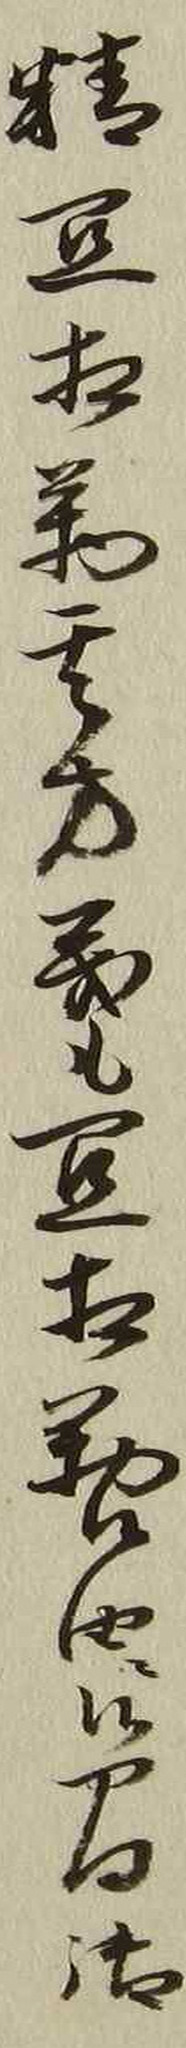精宜相勤其方義も宜相勤候由ニ候間御
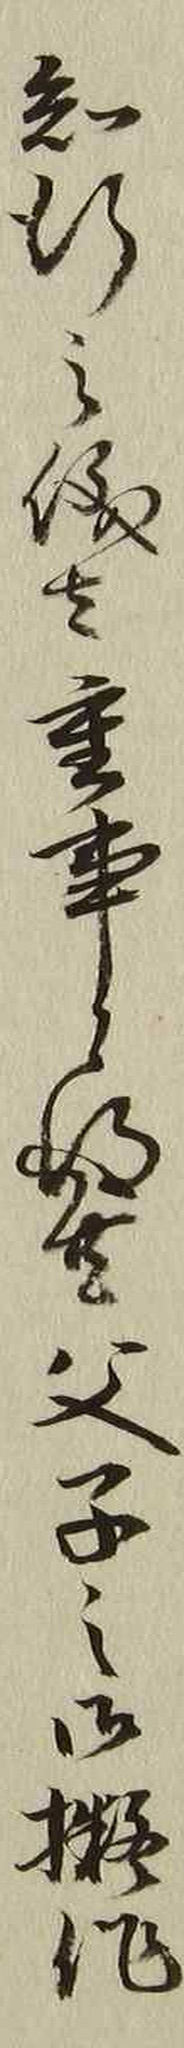知行之儀は重事候得共父子之御擬作
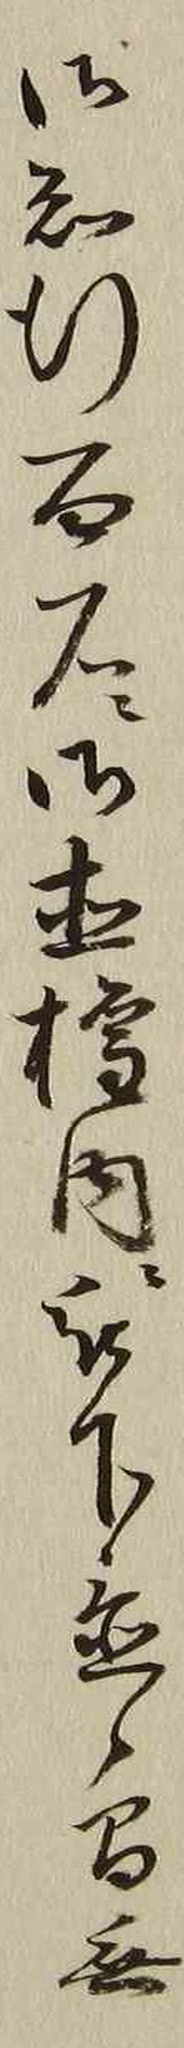御知行百石ニ相直権内ニ被下置候間無
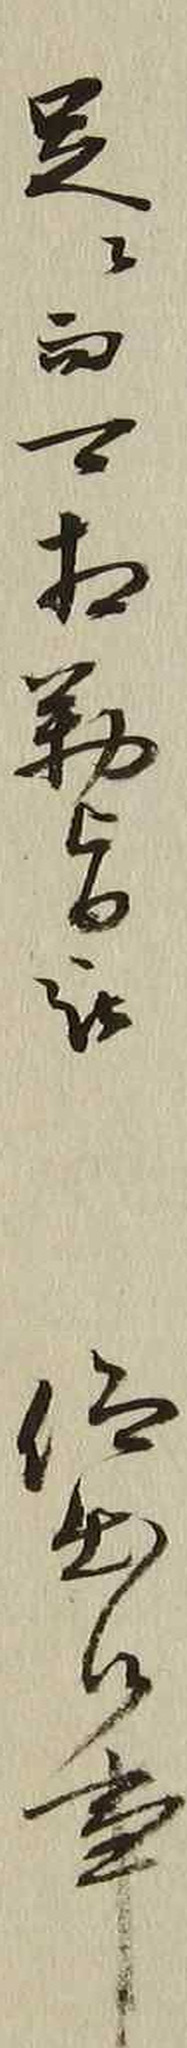足ニ而可相勤旨被仰出候事
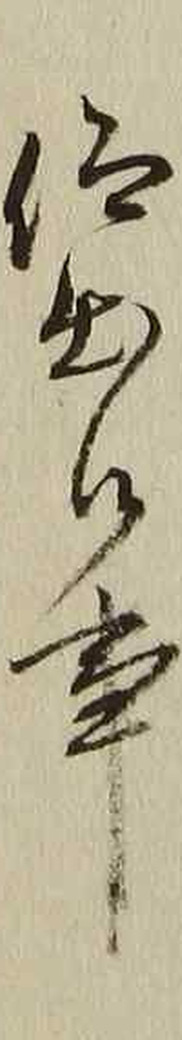仰出候事
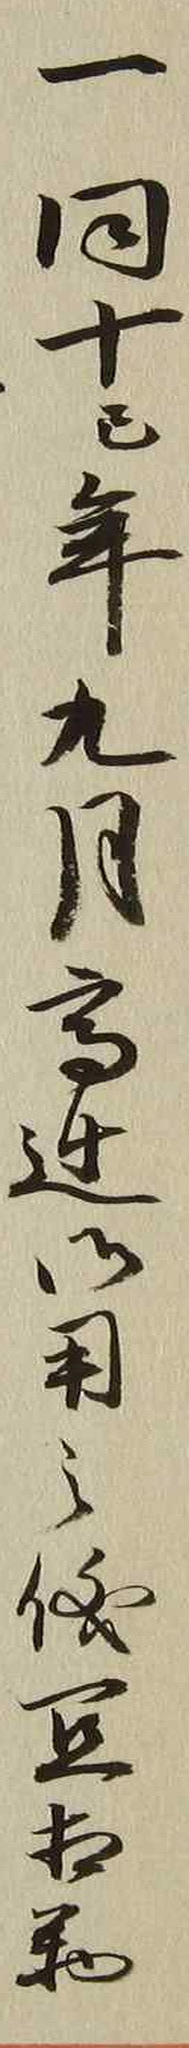一同十巳年九月高辻御用之儀宜相勤
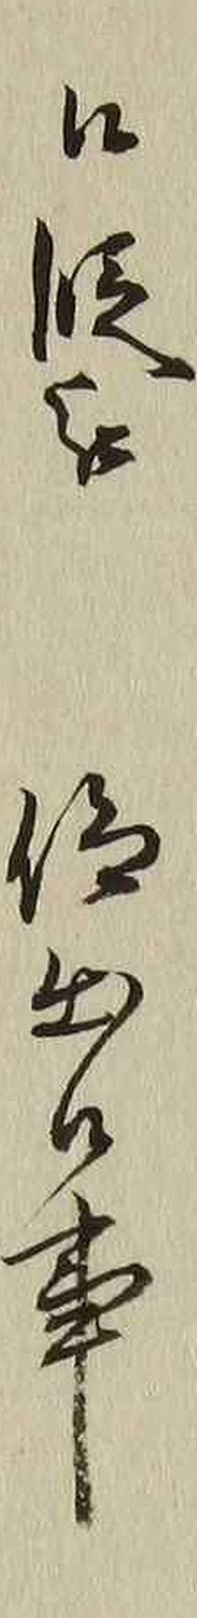候段被仰出候事
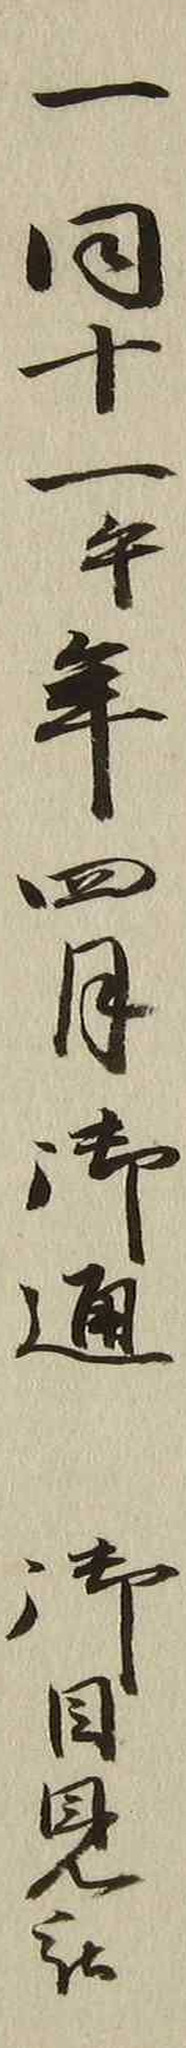一同十一午年四月御通御目見被
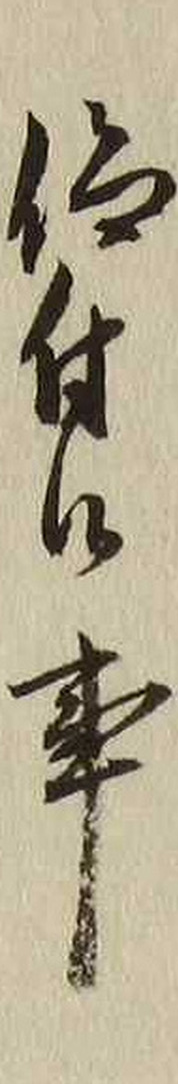仰付候事
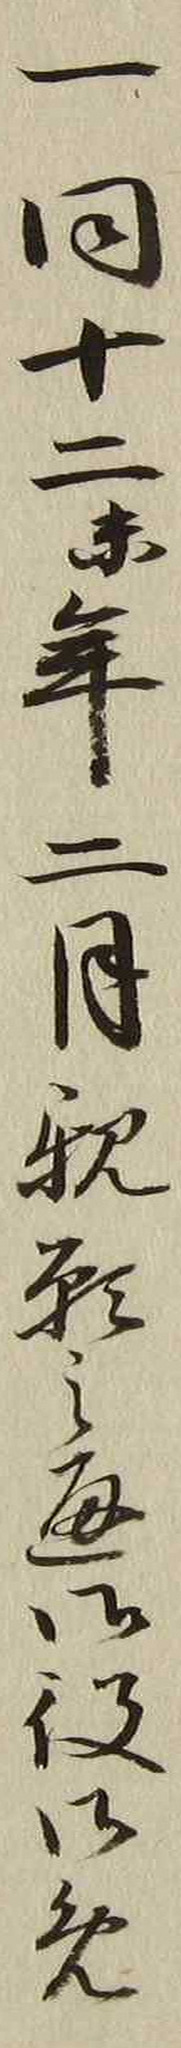一同十二未年二月親願之通御役御免
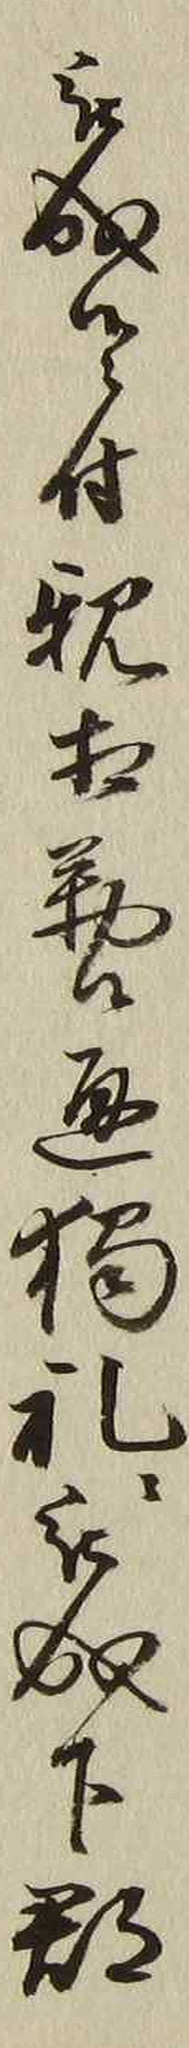被成候ニ付親相勤候通独礼ニ被成下郡
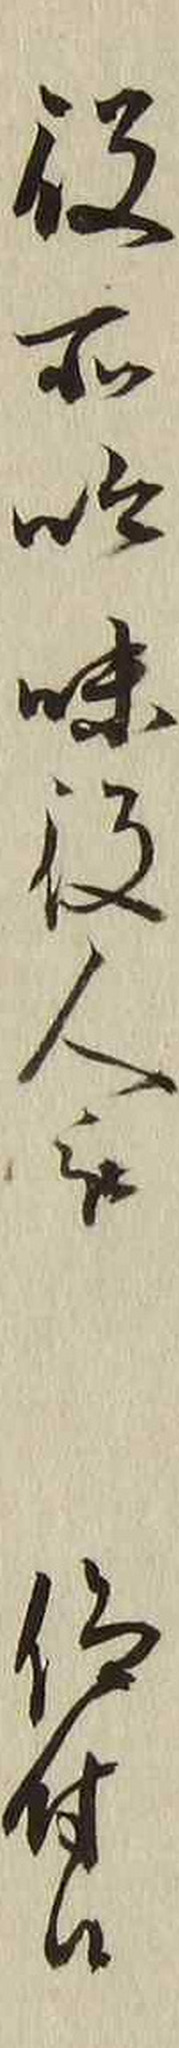役所吟味役人被仰付候
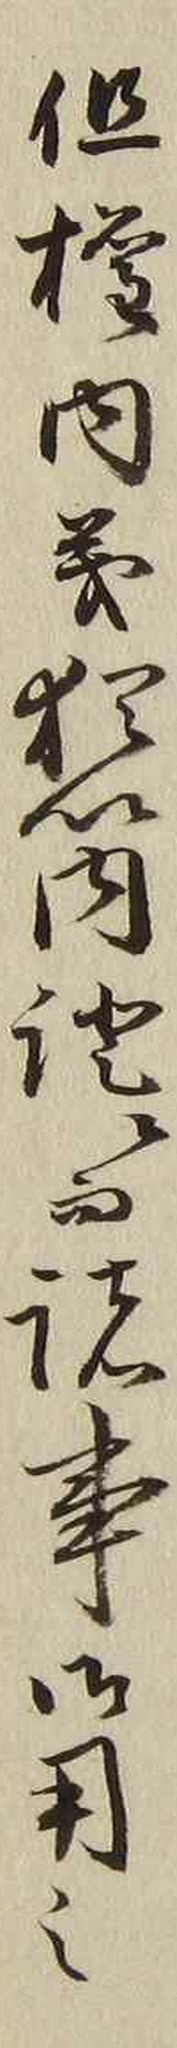但権内義猶以内証ニ而諸事御用之
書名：諸士系譜　巻之61　と之部4
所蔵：会津若松市立会津図書館
